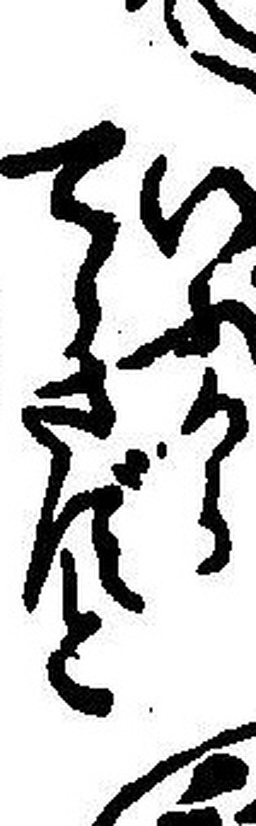てらさずと
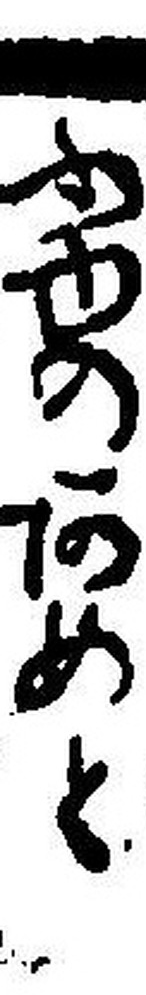ふゆのあめと
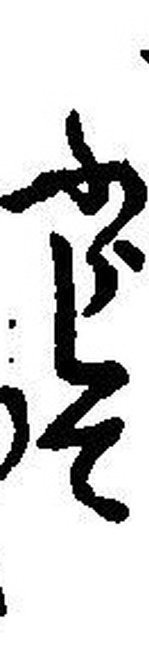ふらして
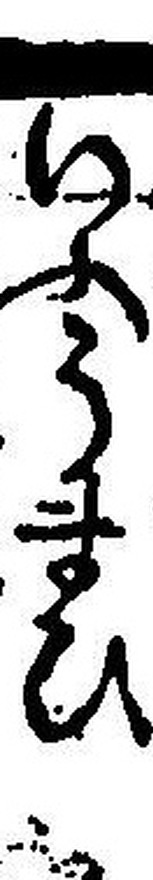いふうまひ
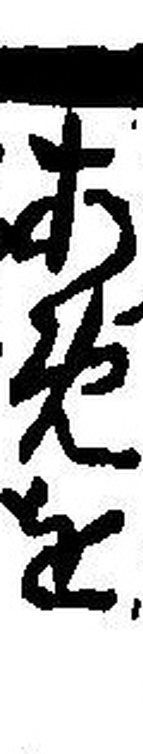あめを
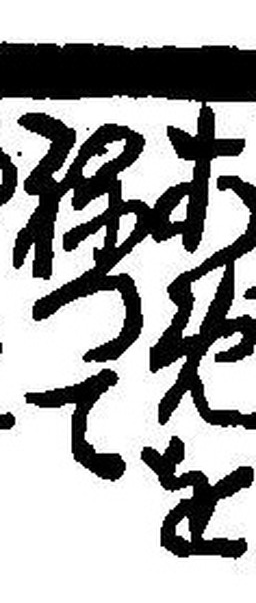ねつて
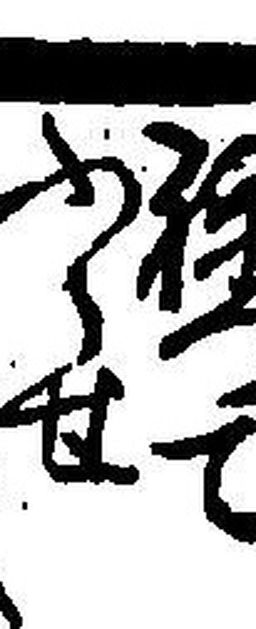ふらせ
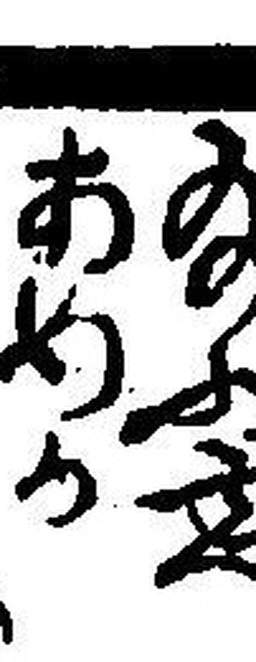あめか
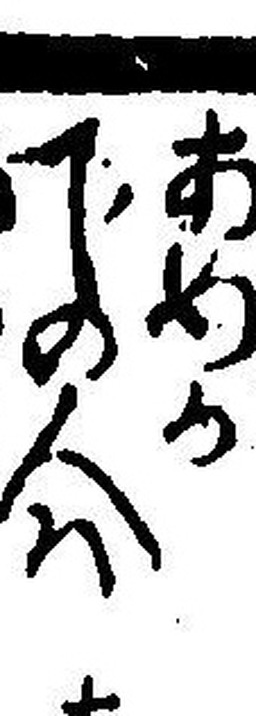下の人は
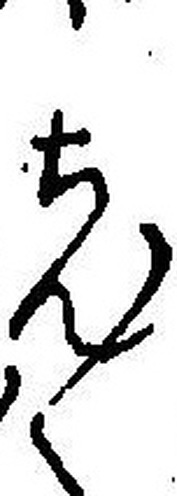ちん〳〵
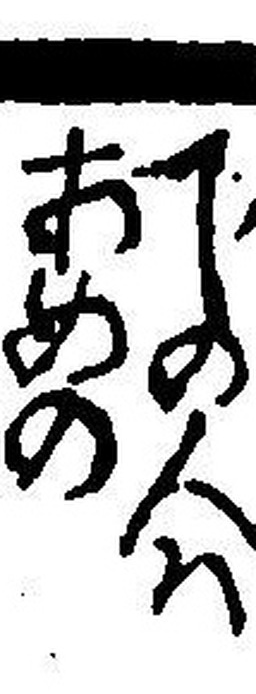あめの
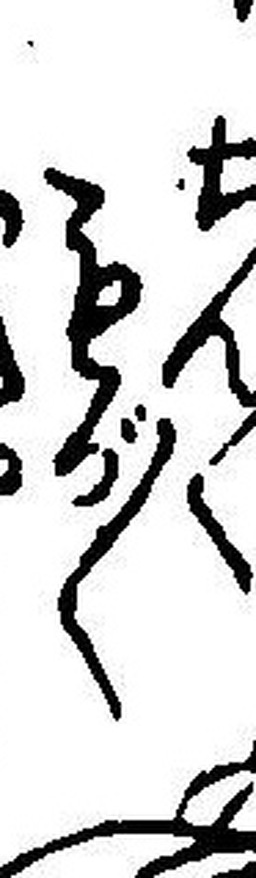もが〳〵
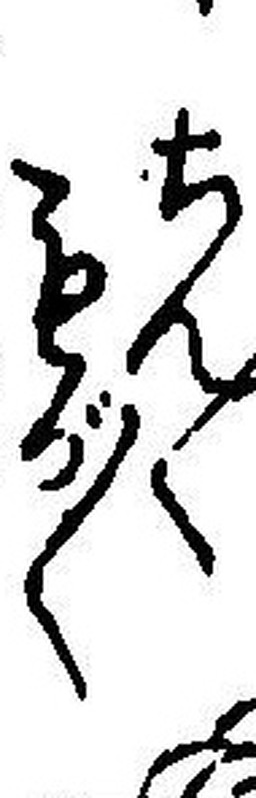もが〳〵
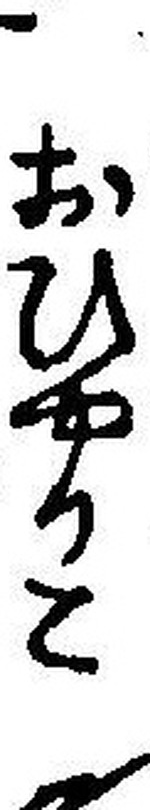おひやりこ
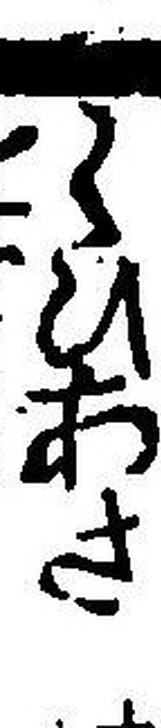くひあさ
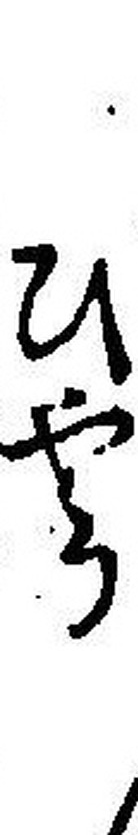ひやり
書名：徳若水縁起金性 / 樹下石上作
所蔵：東京大学総合図書館 General Library in the University of Tokyo, JAPAN
